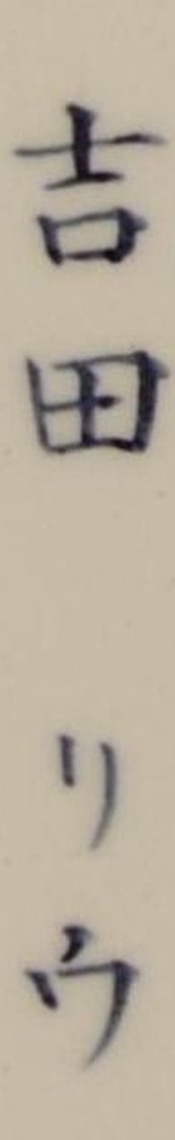吉田リウ
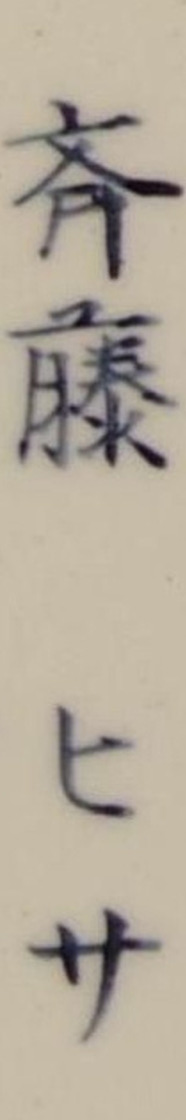斉藤ヒサ
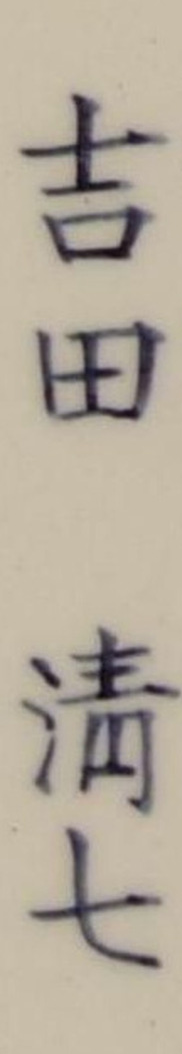吉田清七
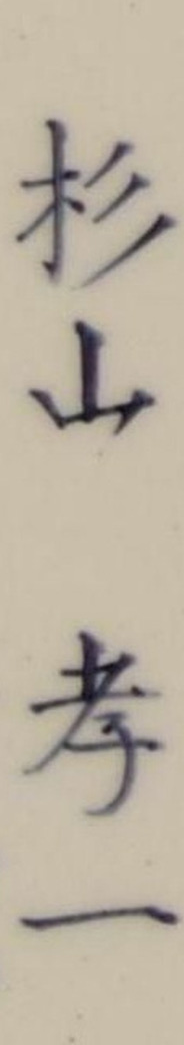杉山孝一

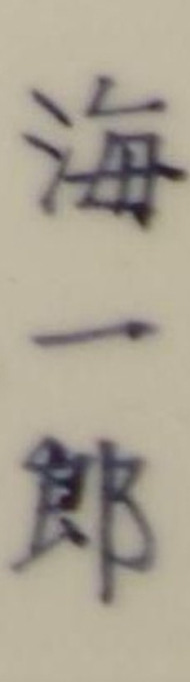海一郎
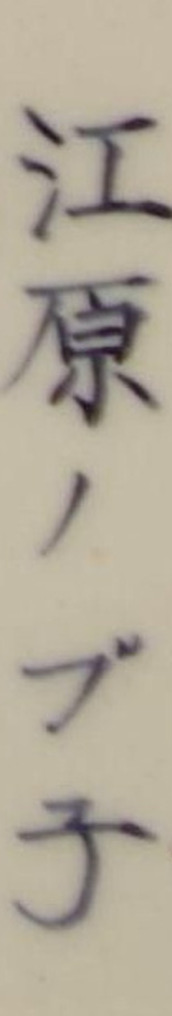江原ノブ子
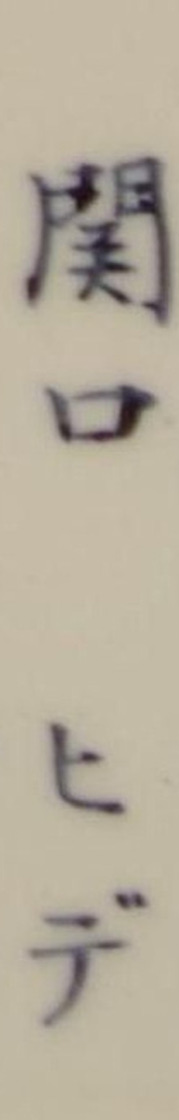関口ヒデ
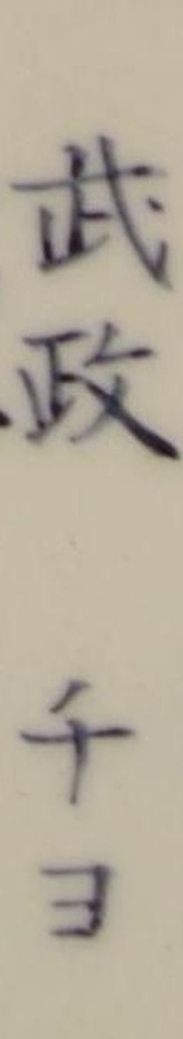武政チヨ
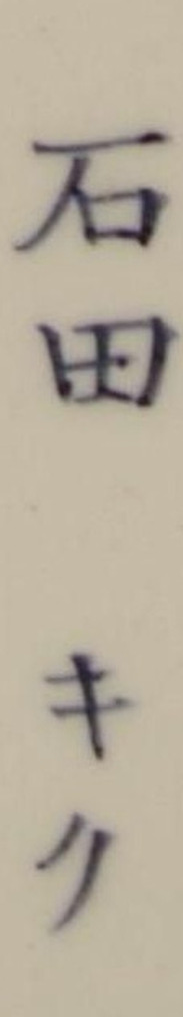石田キク
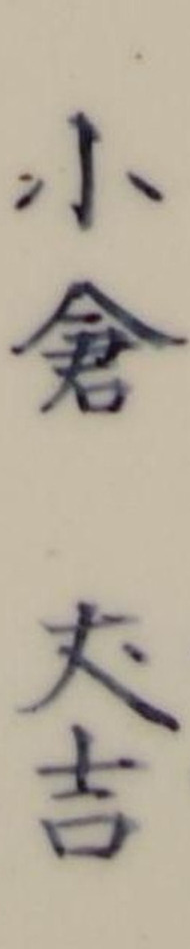小倉丈吉
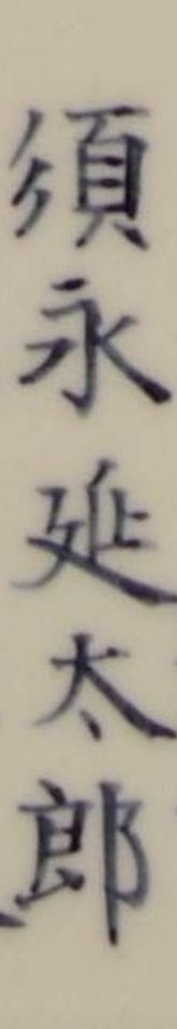須永延太郎
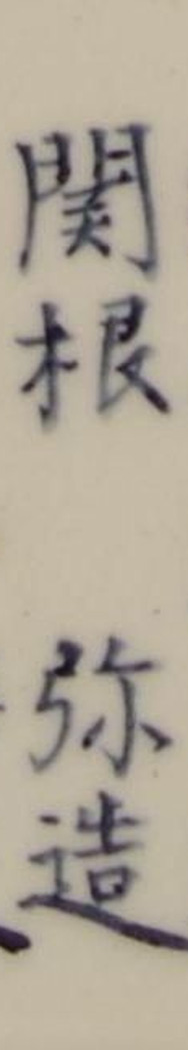関根弥造
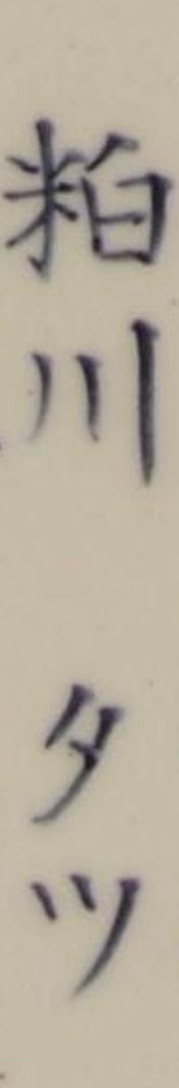粕川タツ
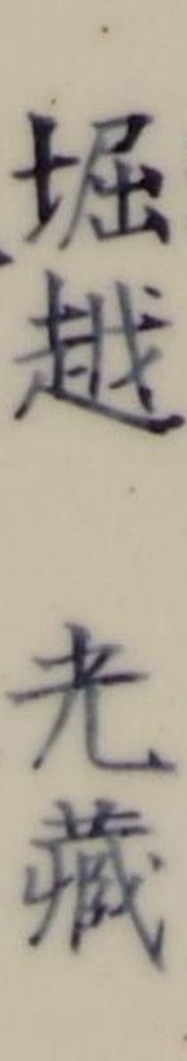堀越光蔵
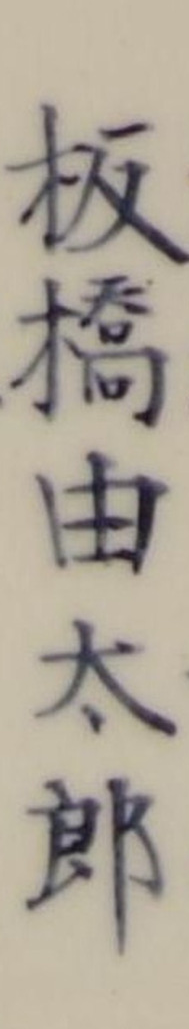板橋由太郎
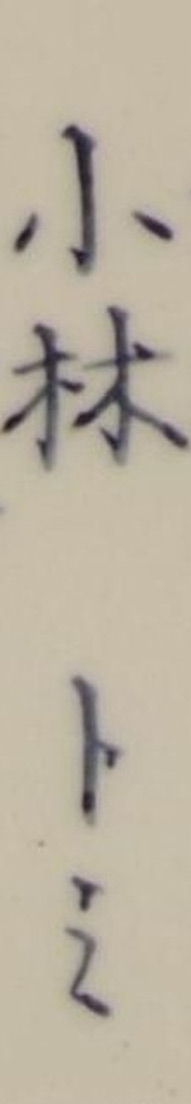小林トミ
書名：M~S
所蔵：高野山金剛峯寺
